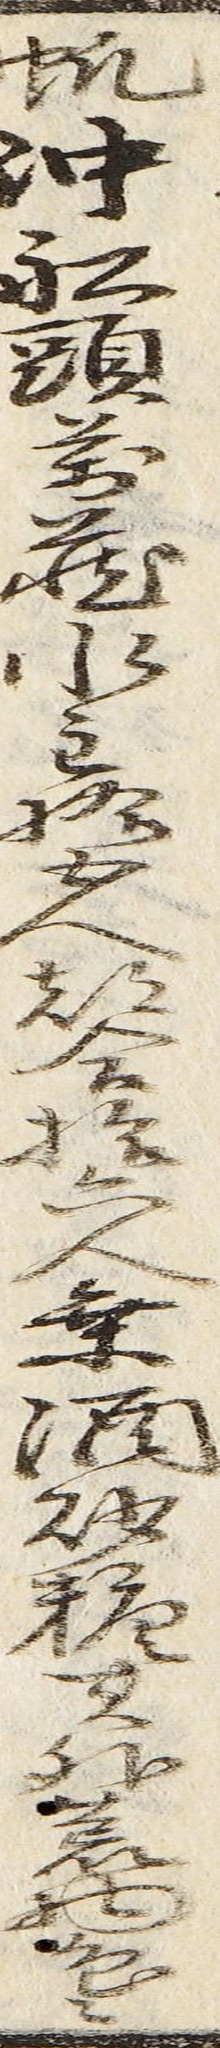帆沖船頭万蔵水主拾五人都合拾六人乗酒砂糖其外荒物色々
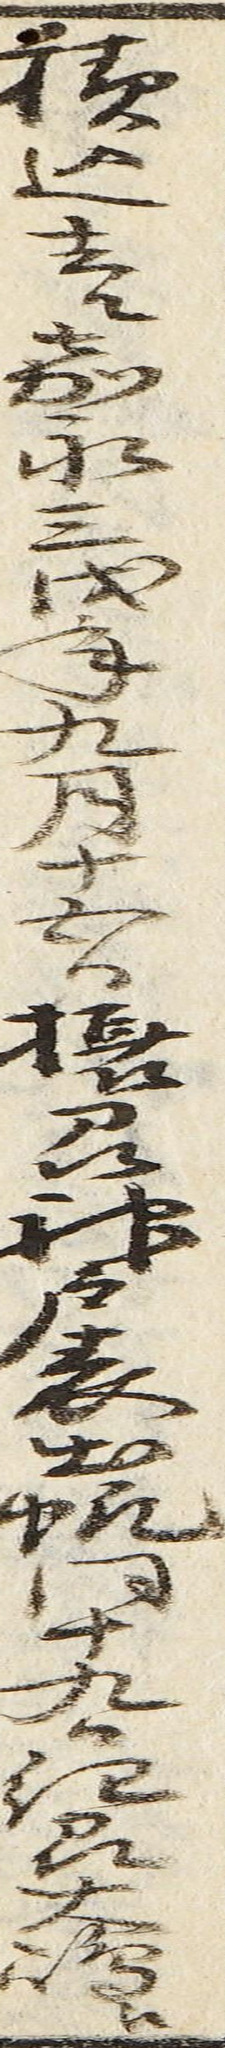積込去る嘉永三戌年九月十六日摂州神戸表出帆同十九日紀州大島江
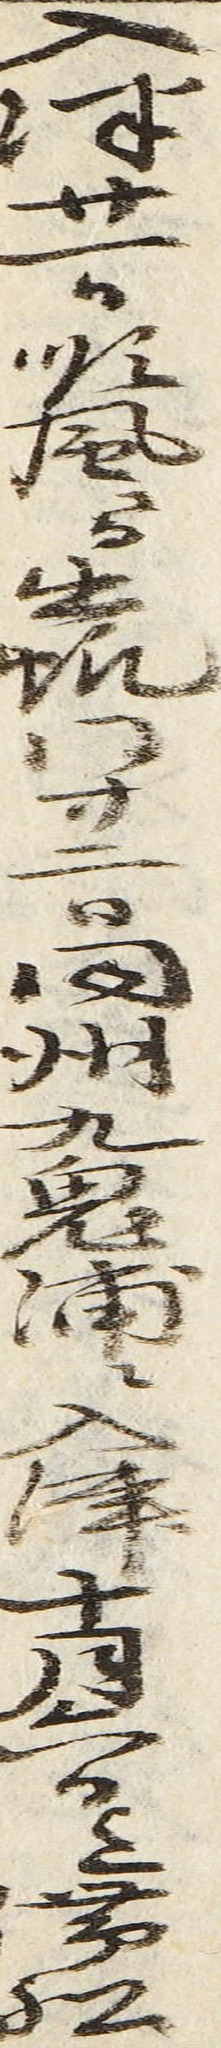入津廿一日順風に而出帆同廿二日同州九鬼浦に入津十月六日迄滞船
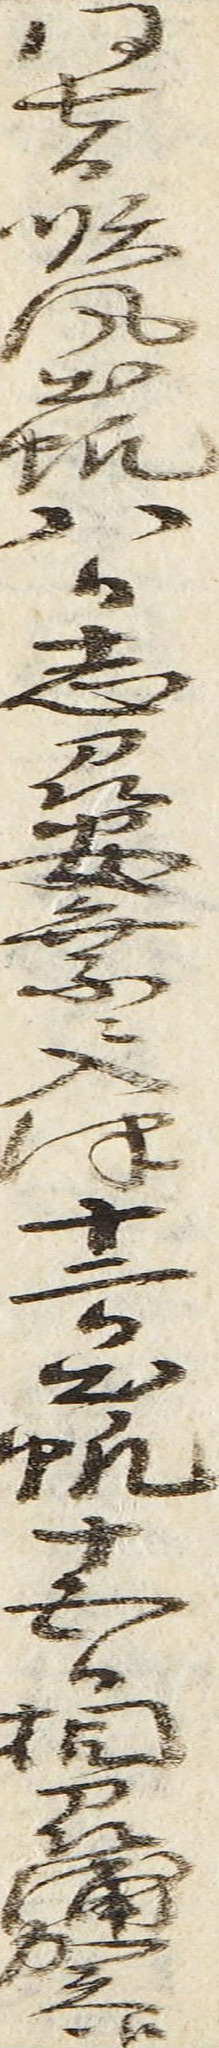同七日順風出帆八日志州安乗に入津十二日出帆十五日相州浦賀江
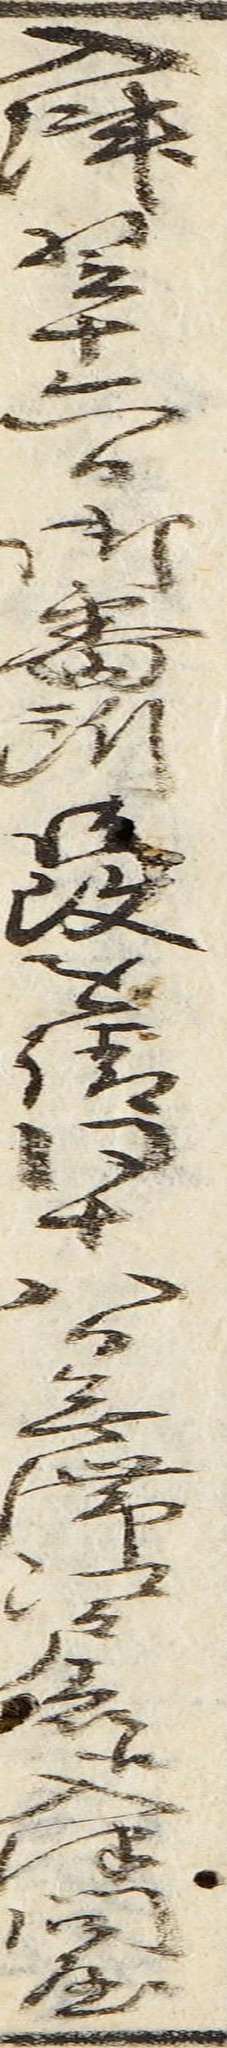入津翌十六日御番所御改を請同十八日無滞江戸表江入津問屋
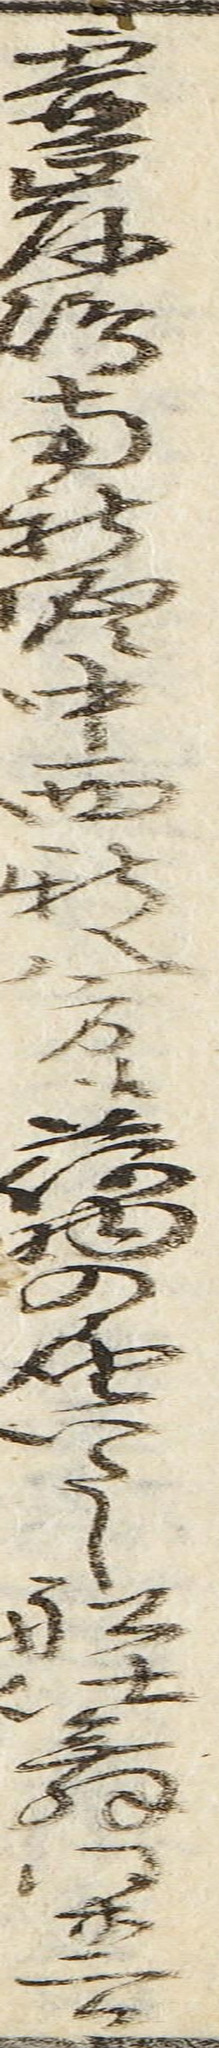霊岸島南新堀中西新八方江荷物の届いたし船仕舞同廿二日
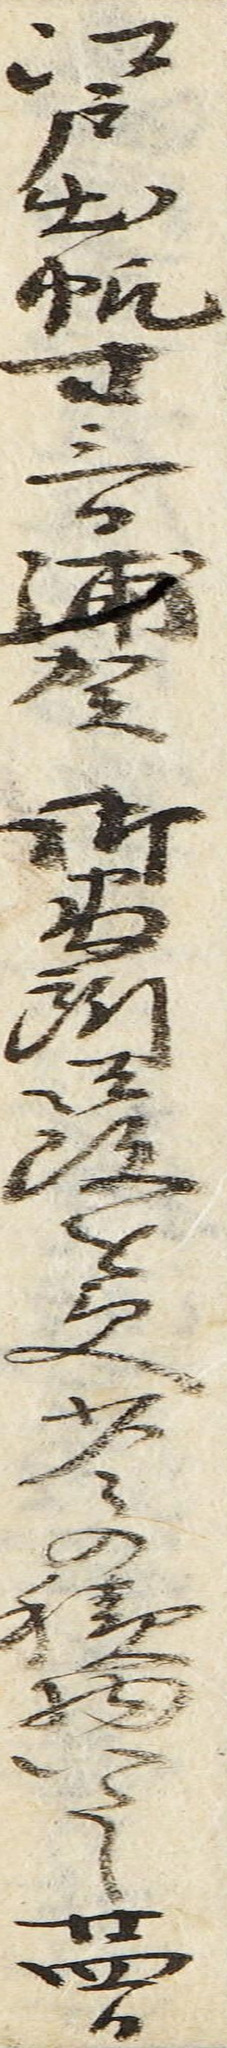江戸出帆廿三日浦賀御番所御改を受少々の積物いたし廿四日
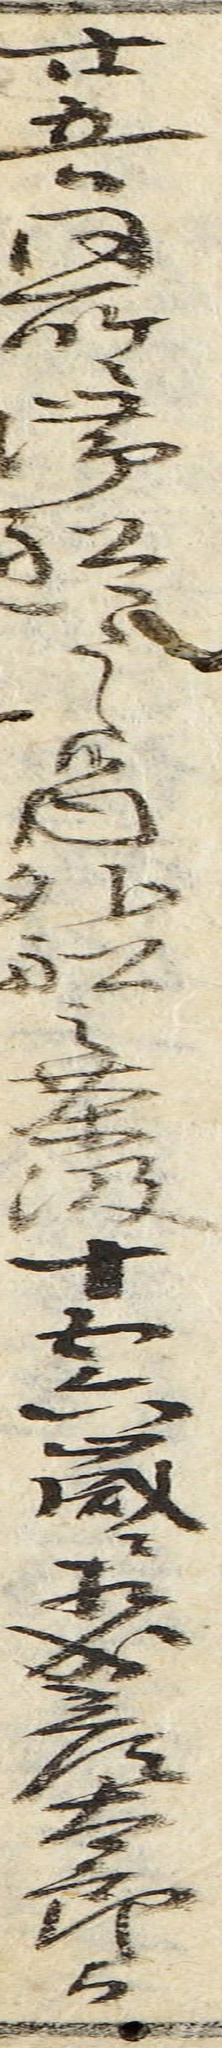廿五日同所に滞船いたし候内外船之茶汲十五六歳に相成彦太郎と

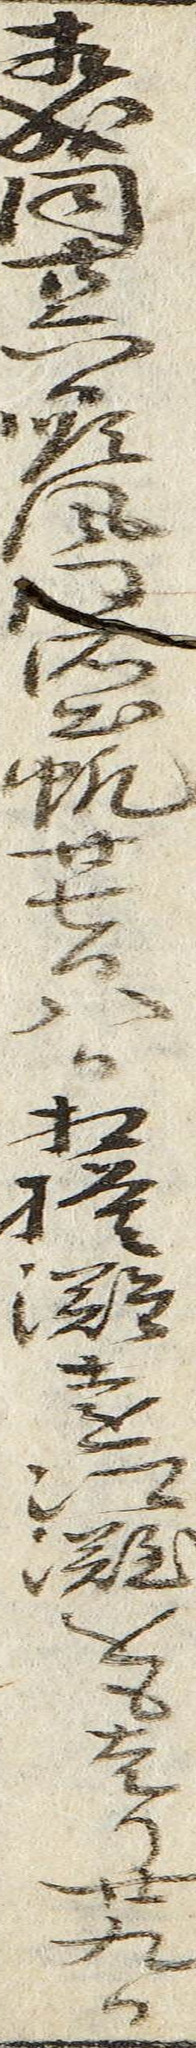相成同廿六日順風同所出帆廿七日八日相模灘遠江灘をも走り廿九日
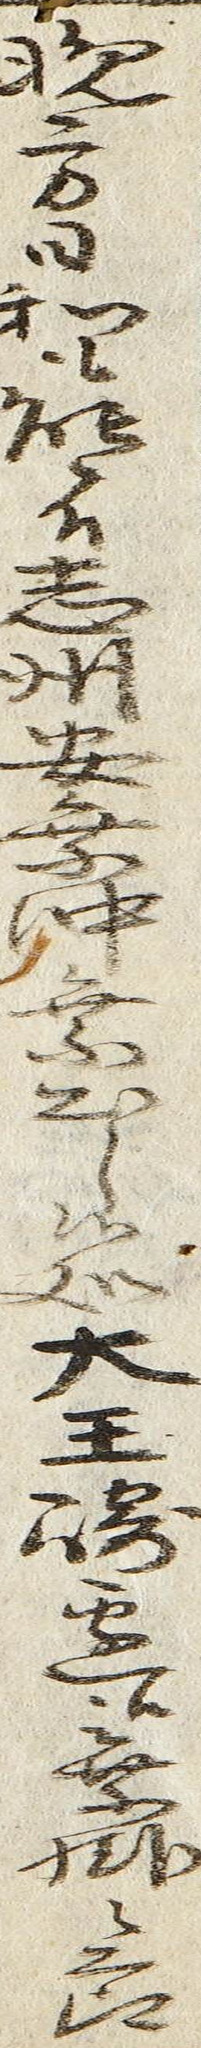晩方日和も能に付志州安乗沖乗出し候処大王崎辺江乗掛之節
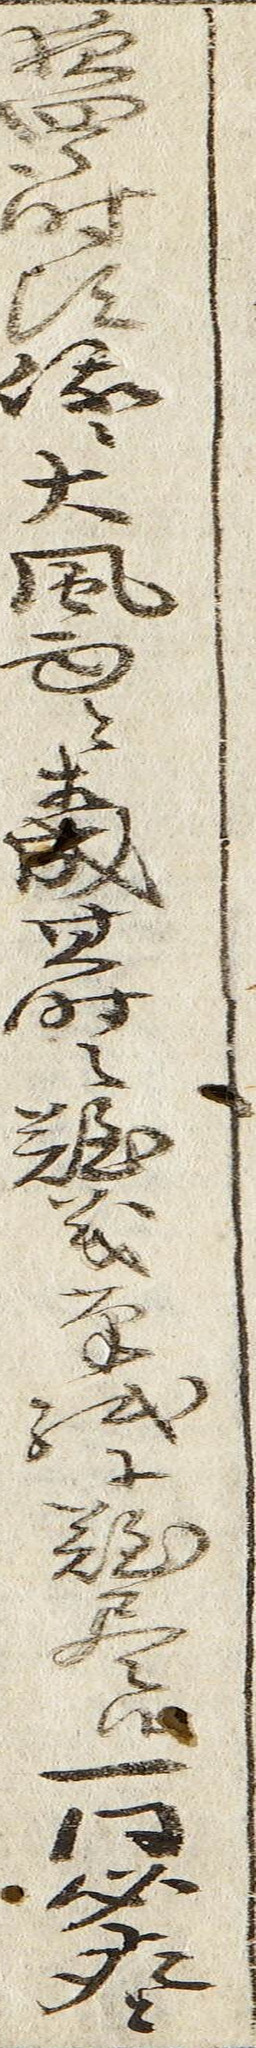夜四つ時頃俄に大風雨と相成其時之難義筆紙に難尽候一同必死に
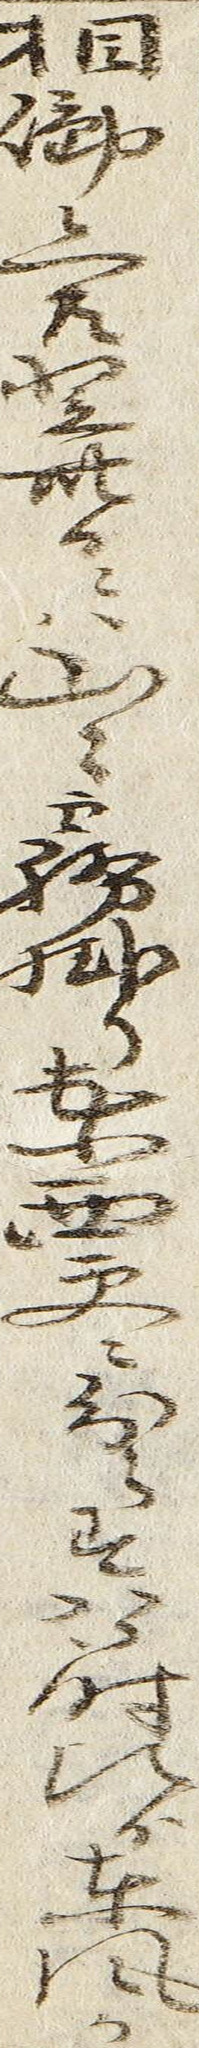相働候へ共翌丗日には山に霧掛り東西更に分らす八つ時頃ゟ東風か
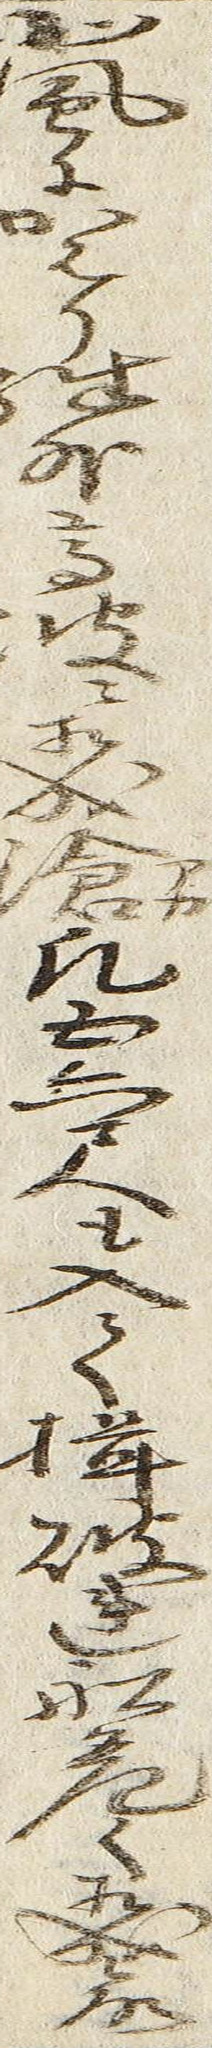北風にかはり殊外高波に相成滄凡五六尺も入て楫破れ船危く相成候故
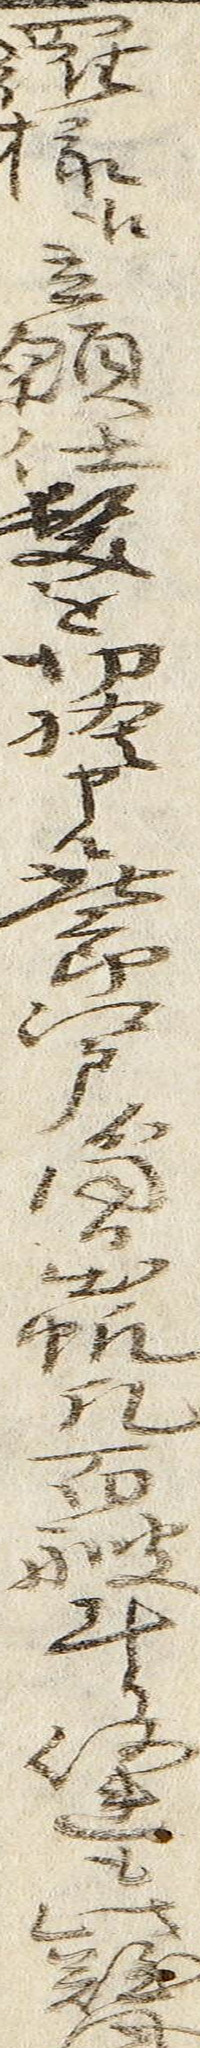羅様江立願仕髪を切捨申候此節江戸ゟ同日出帆凡百艘計り何れも此難風
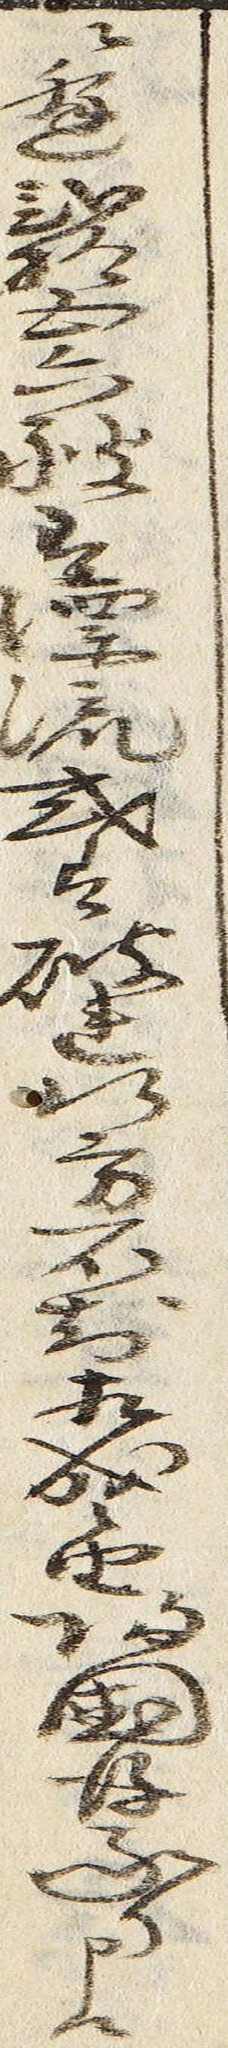に逢弐拾五六艘は漂流或は破れ行方不知相成候由帰国後承り申候
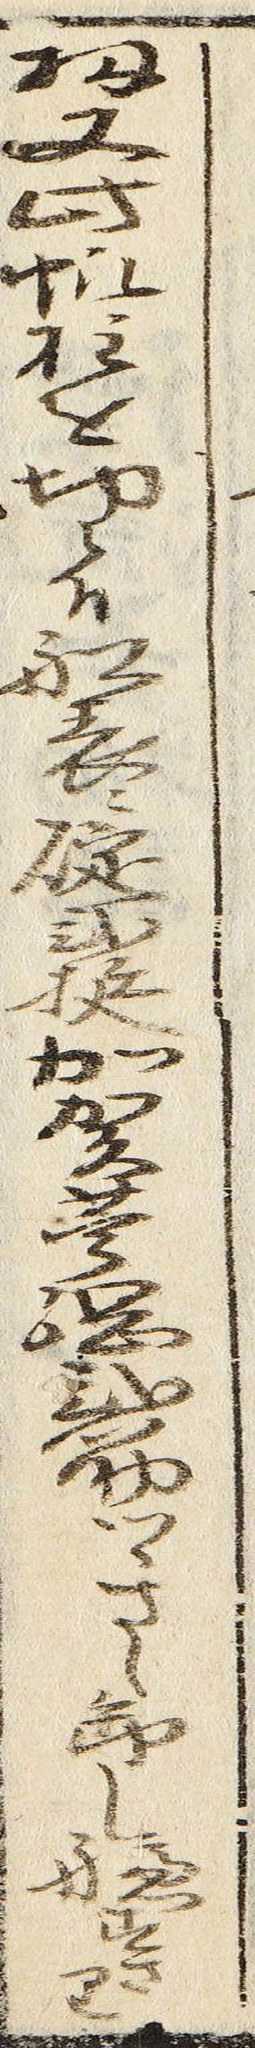扨又此帆柱を切に付船表に碇弐挺加賀苧綱弐筋つゝさし卸し艫すさり
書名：漂流夢物語
